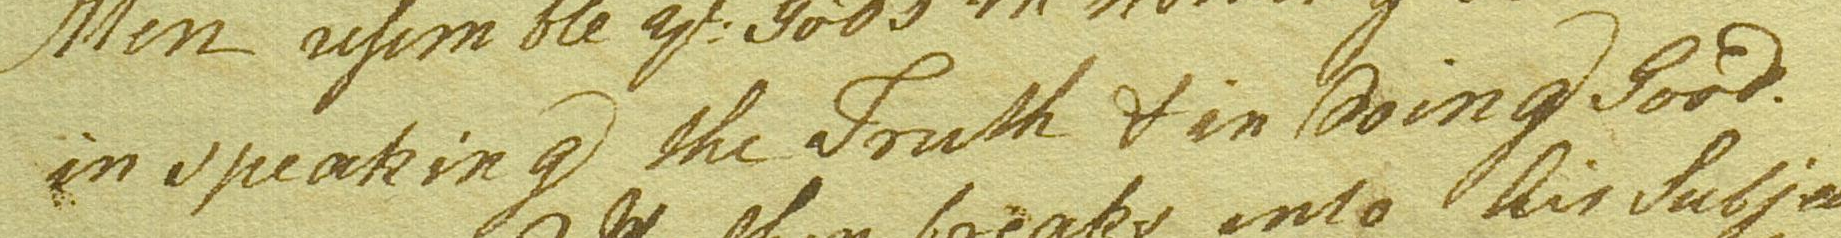in speaking the Truth & in doing Good.
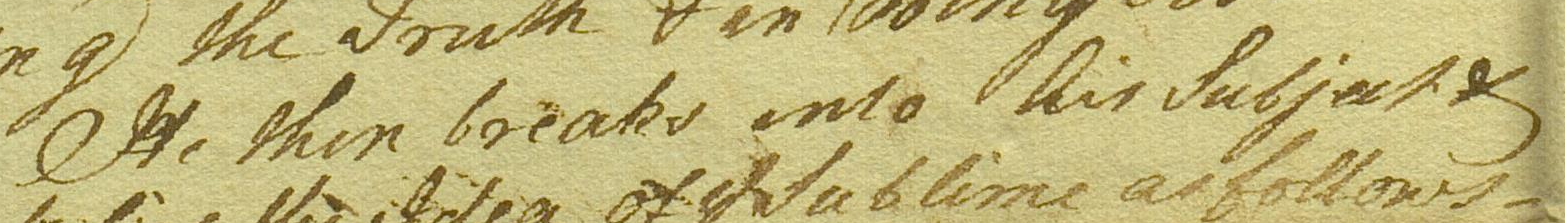He then breaks into his Subject &
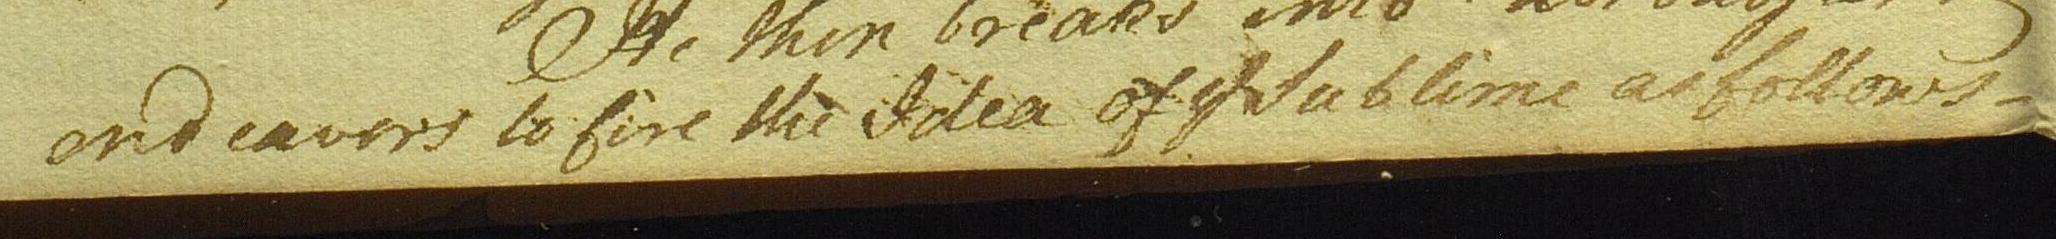endeavors to fire the Idea of y^e Sublime as follows-
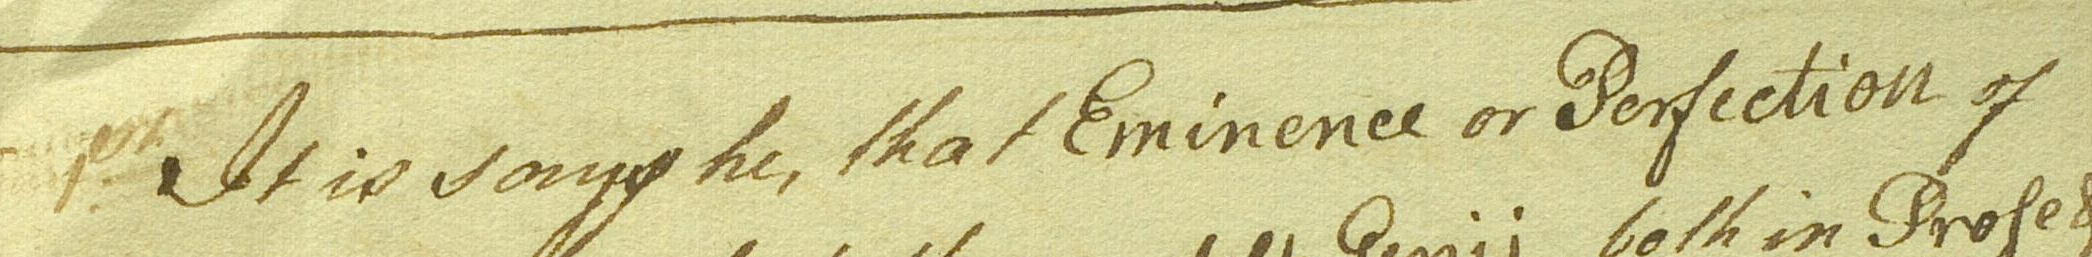It is says he, that Eminence or Perfection of
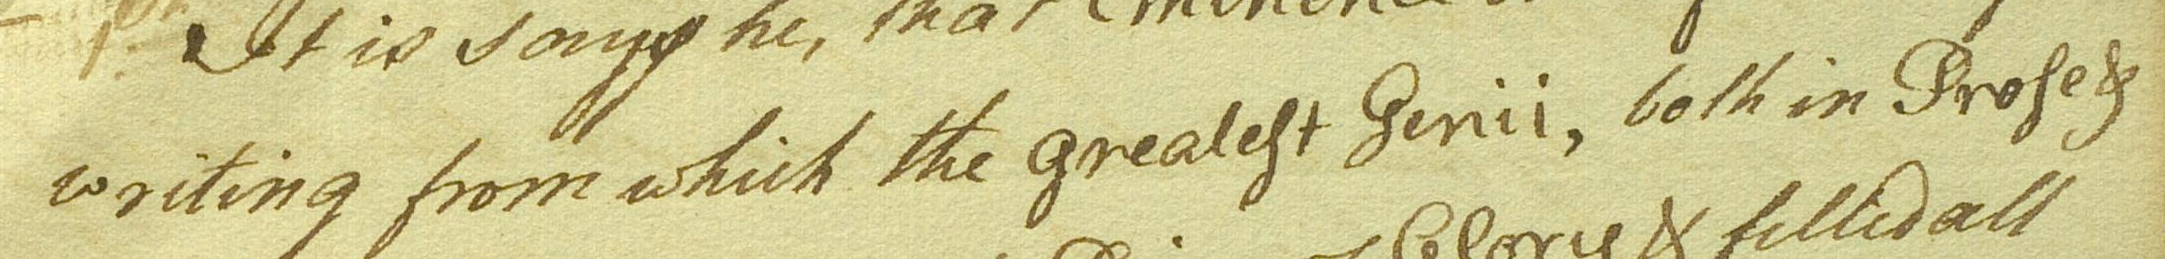writing from which the greatest Genii, both in Prose &
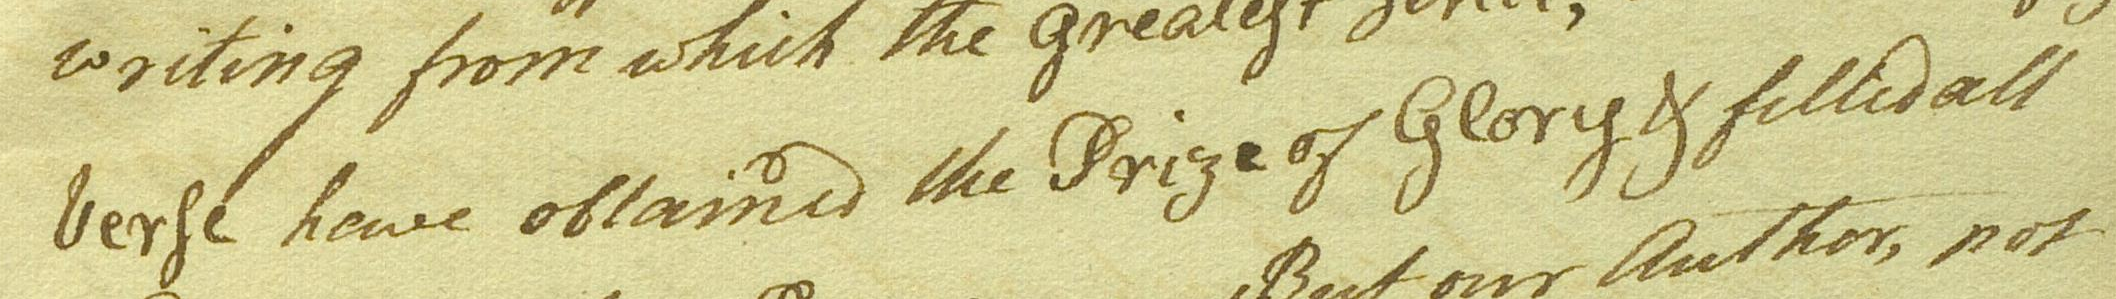Verse have obtained the Prize of Glory & filled all
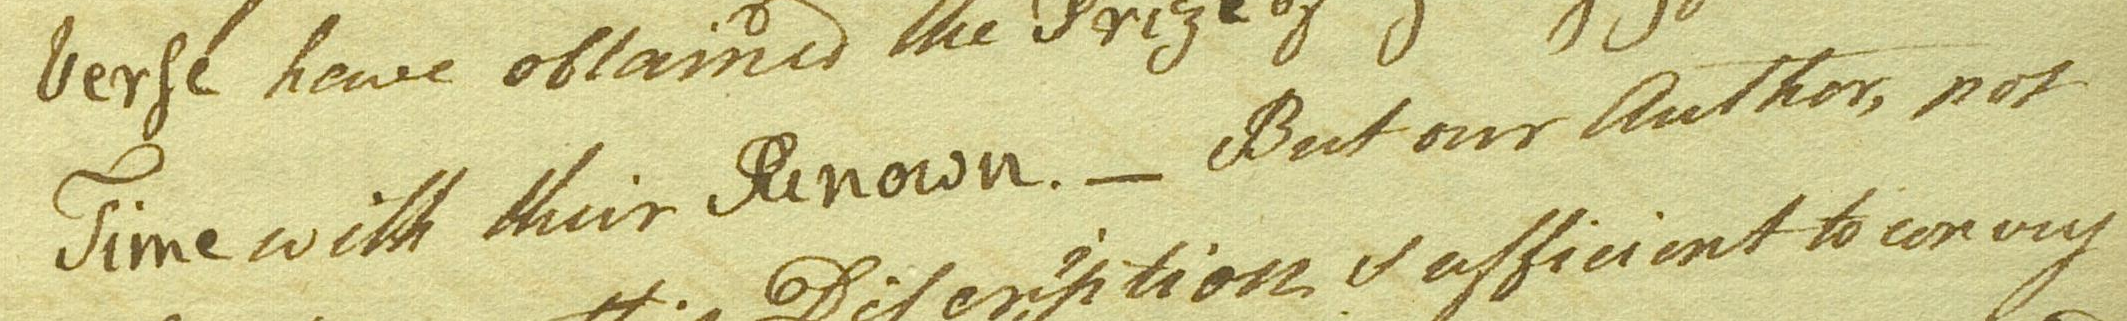Time with their Renown.- But our Author, not
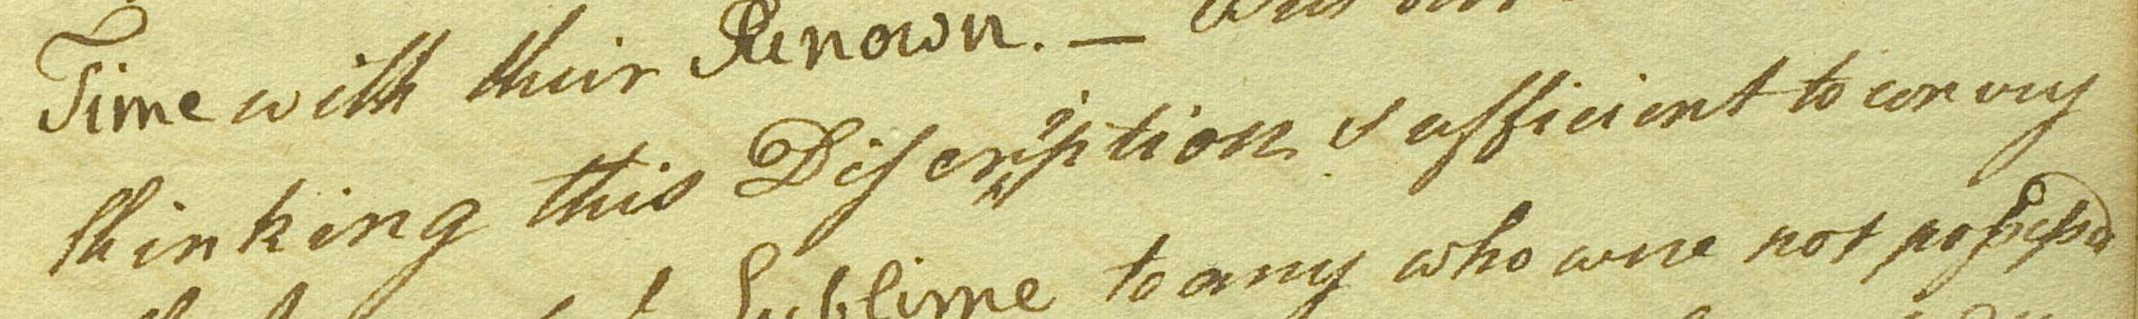thinking this Descr^iption sufficient to convey
